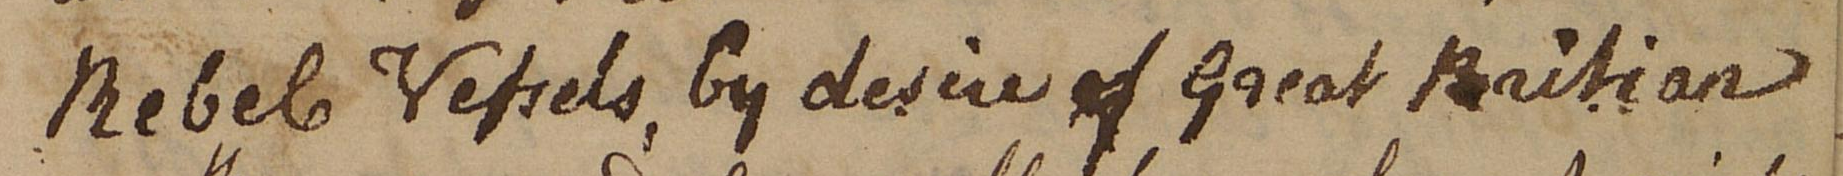Rebels Vessels, by desire of Great Britian
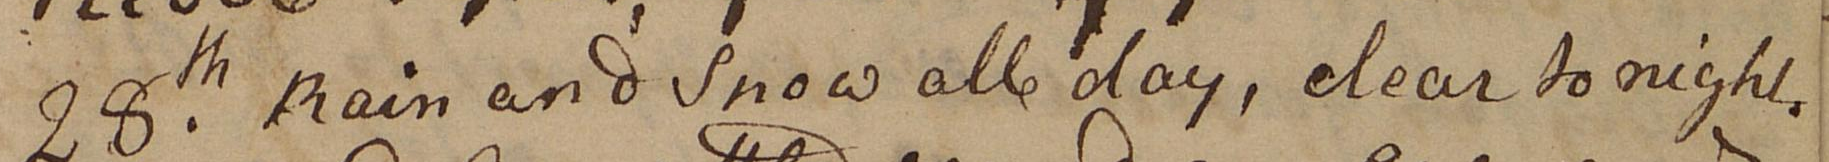28^th. Rain and Snow all day, clear to night.
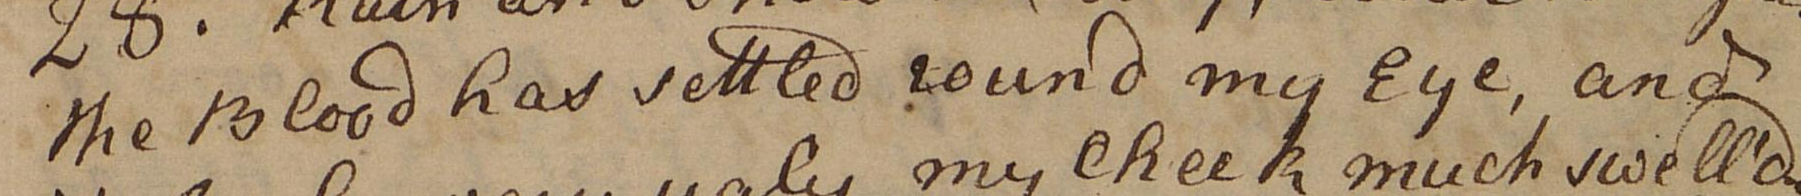the Blood has settled round my Eye, and
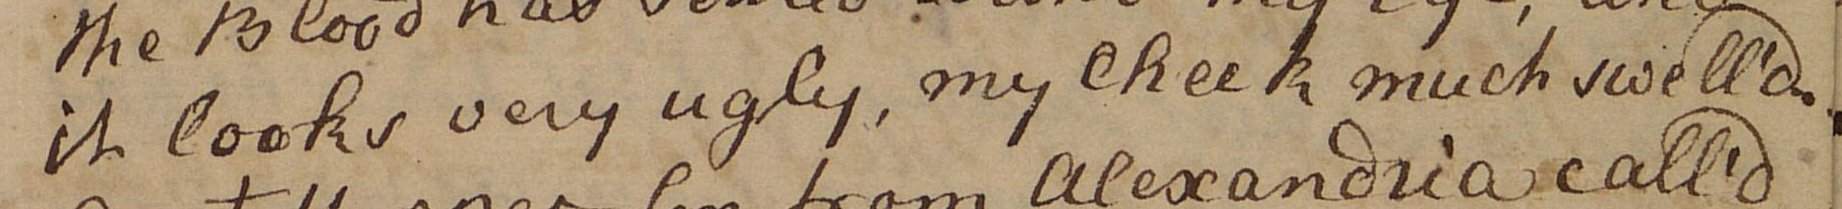it looks very ugly, my cheek much swell'd.
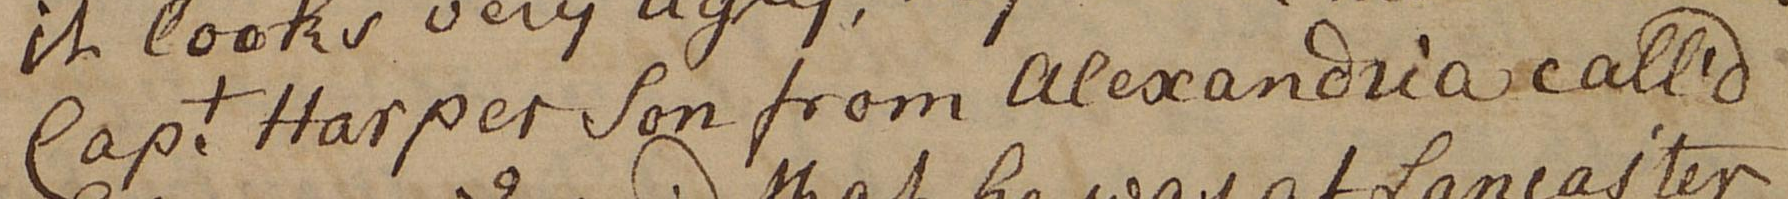Cap^t. Harper Son from Alexandria call'd
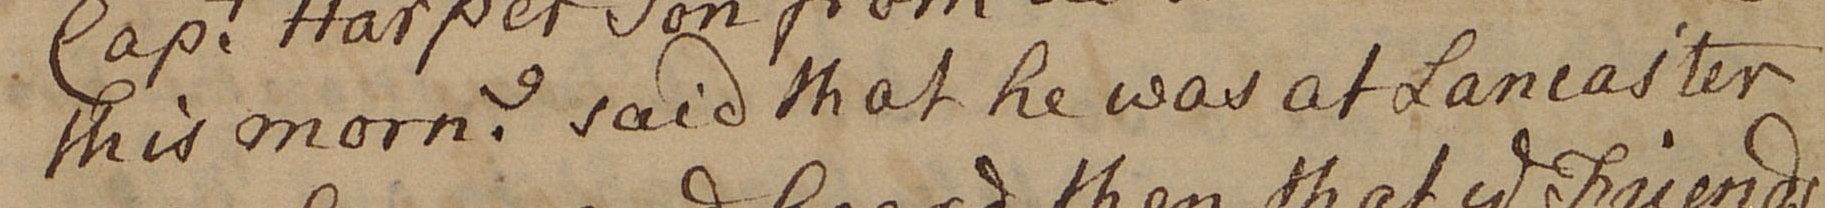this morn^g. said that he was at Lancaster
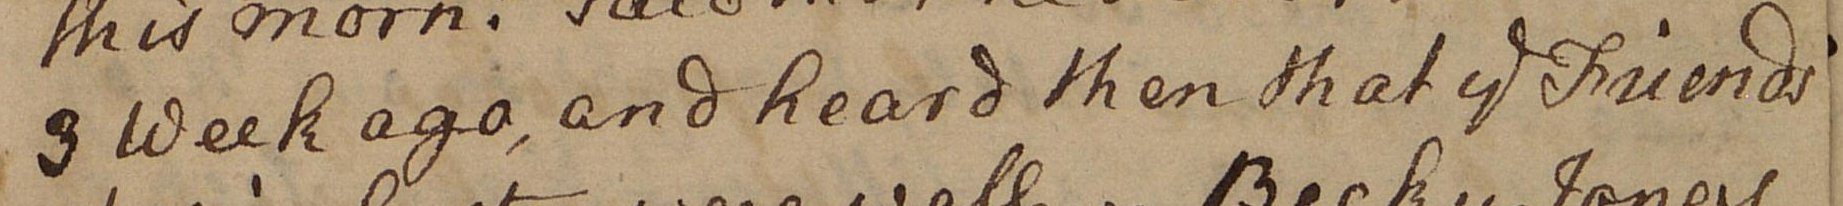3 Week ago, and heard then that y^e Friends
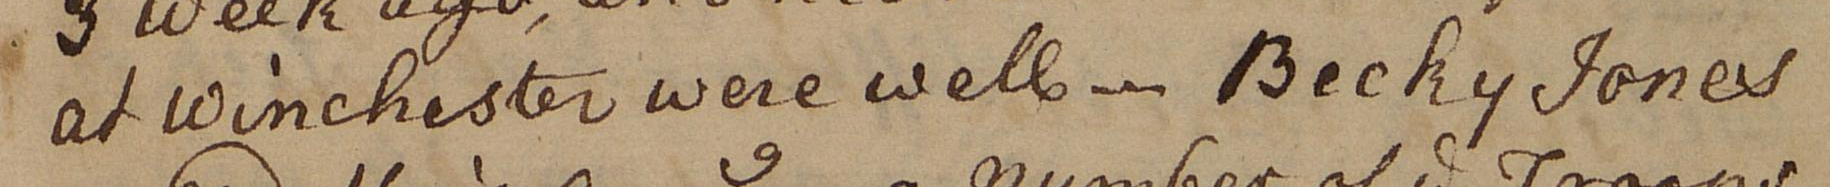at Winchester were well- Becky Jones
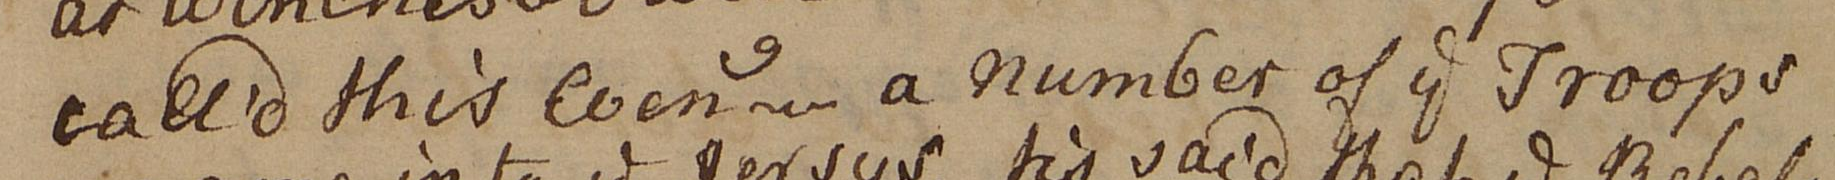call'd this Even^g- a number of y^e Troops
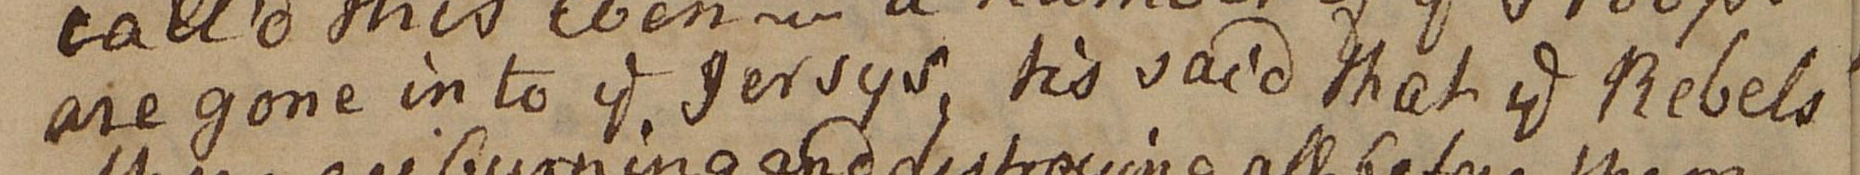are gone in to y^e Jersys, tis said that y^e Rebels
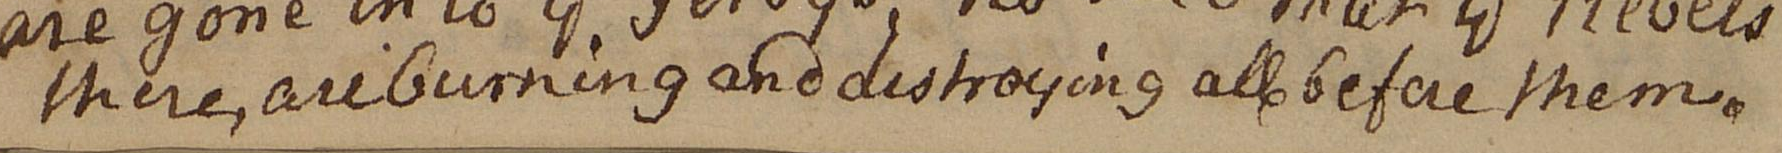there, are burning and distroying all before them.
